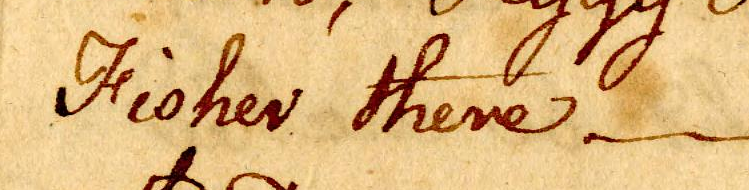Fisher there-
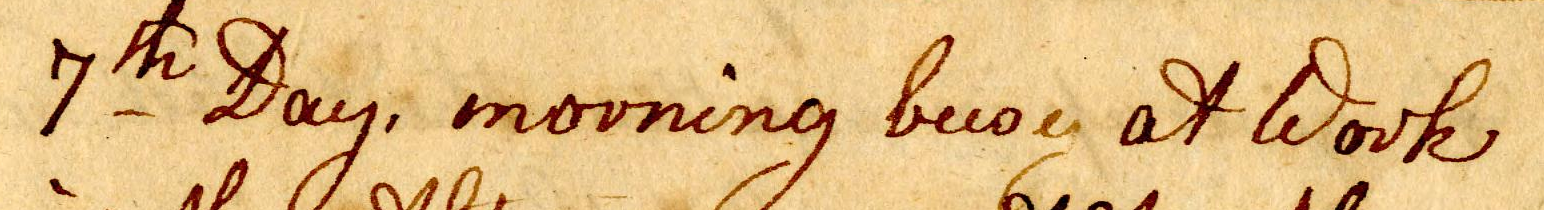7^th Day, morning busy at Work
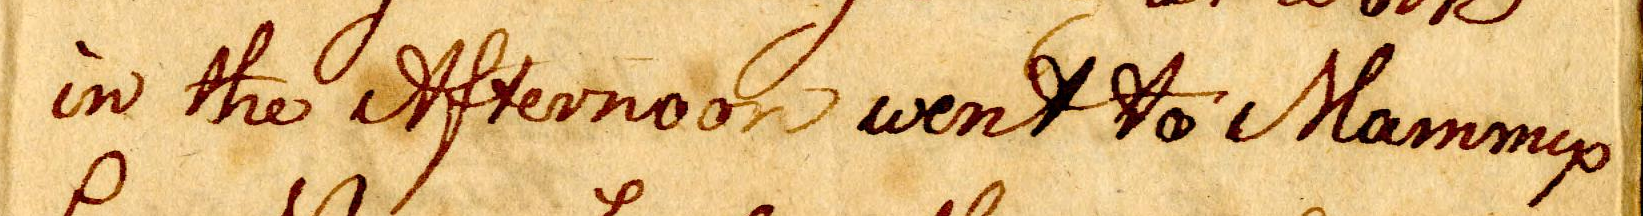in the Afternoon went to Mammys
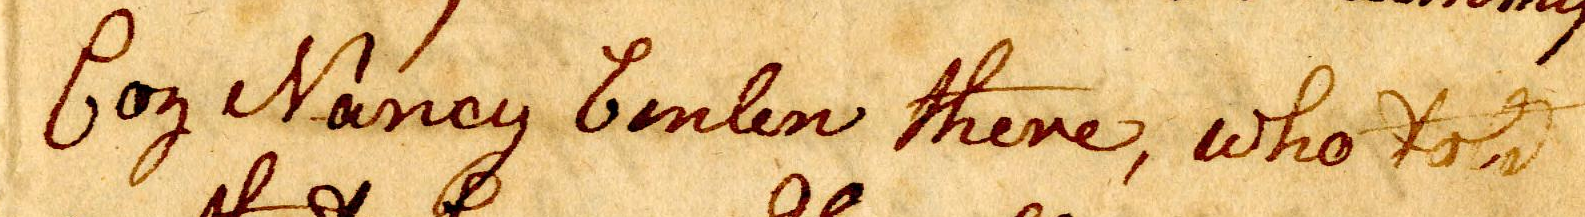Coz Nancy Emlen there, who told
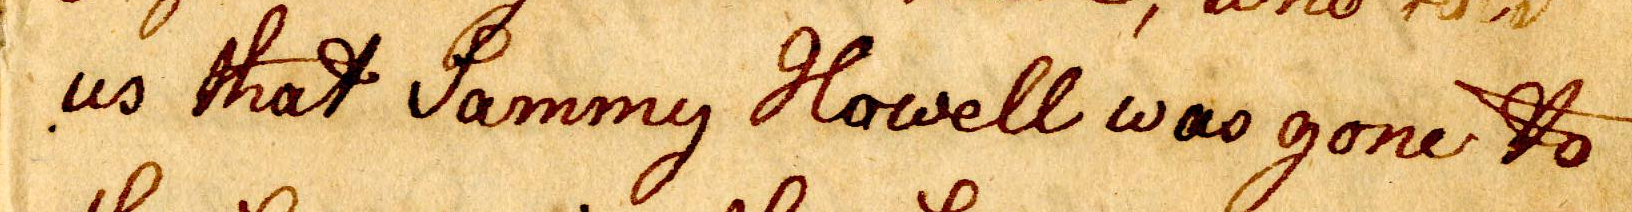us that Sammy Howell was gone to
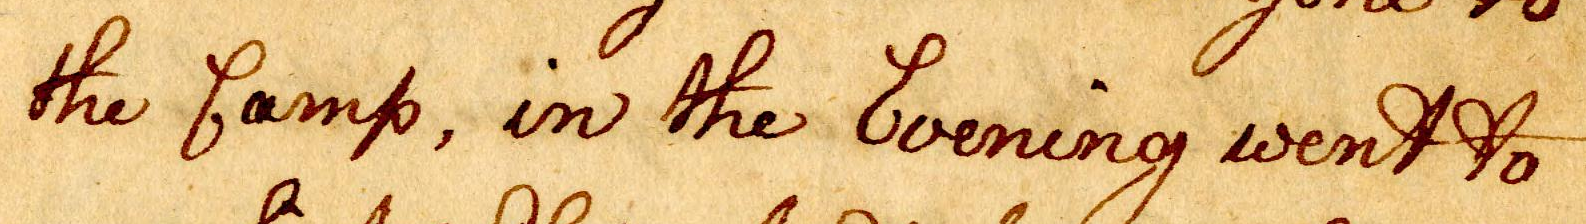the Camp, in the Evening went to
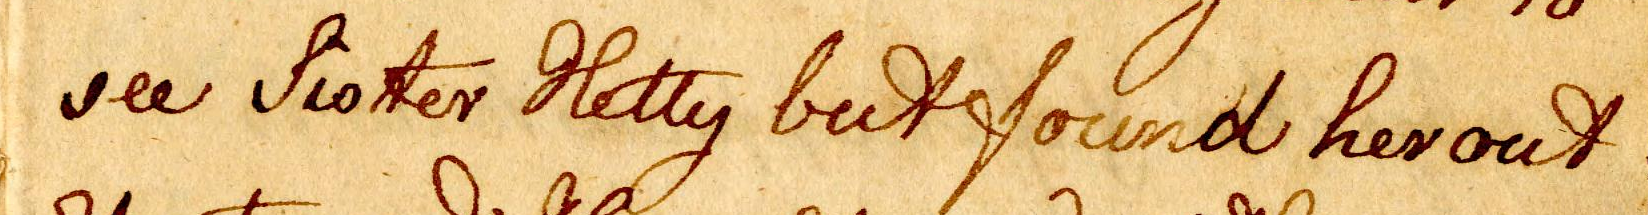see Sister Hetty but found her out
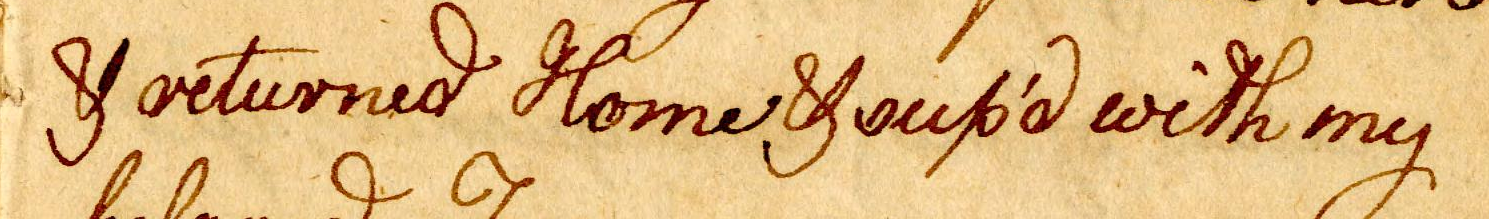& returned Home & sup'd with my
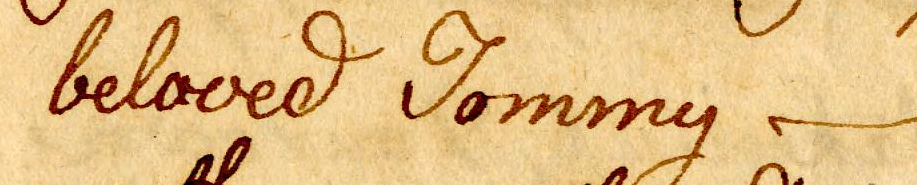beloved Tommy-
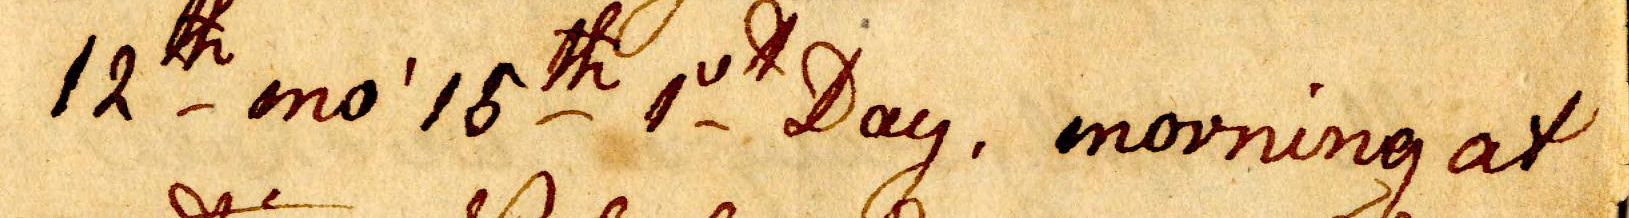12^th Mo' 15^th Day, morning at
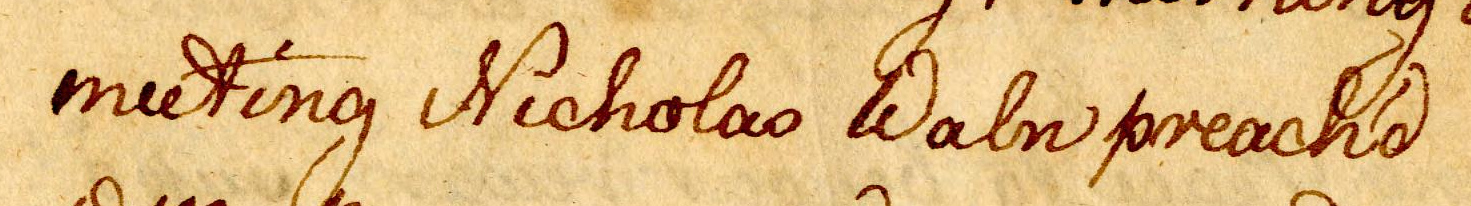meeting Nicholas Waln preach'd
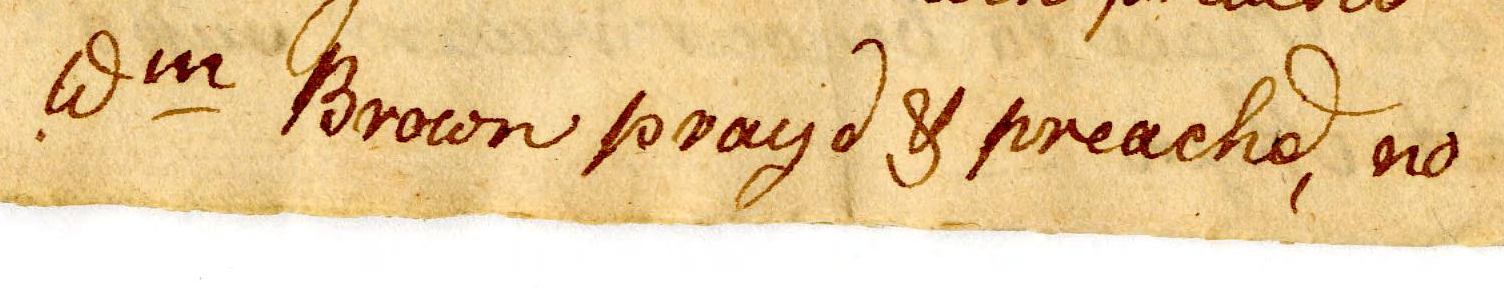W^m Brown prayd & preachd, no
